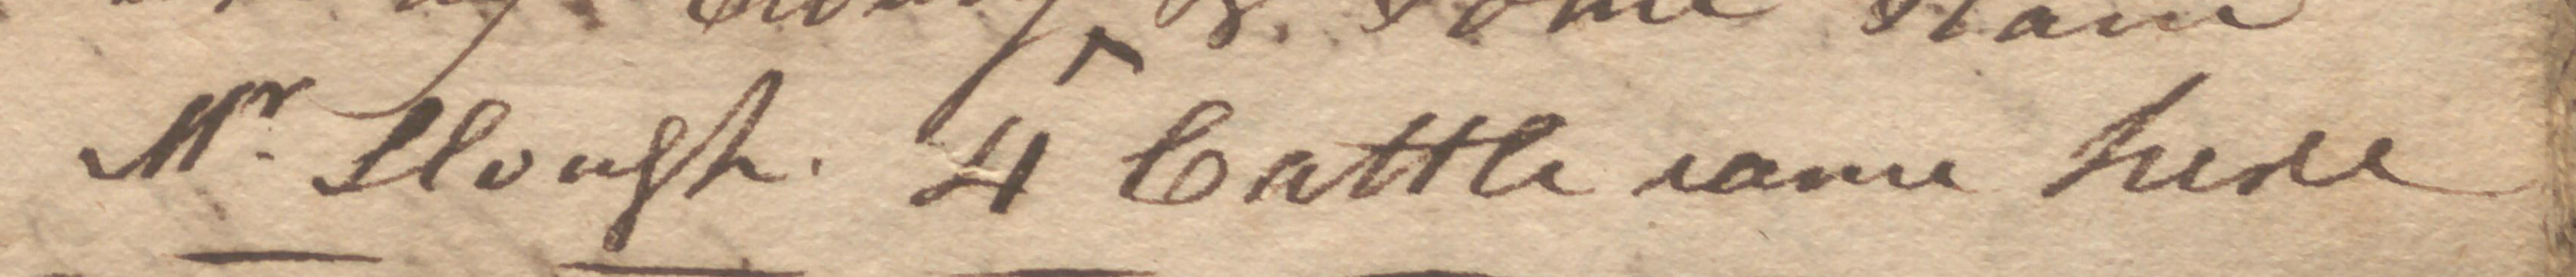M^r. Slough 4 Cattle came here
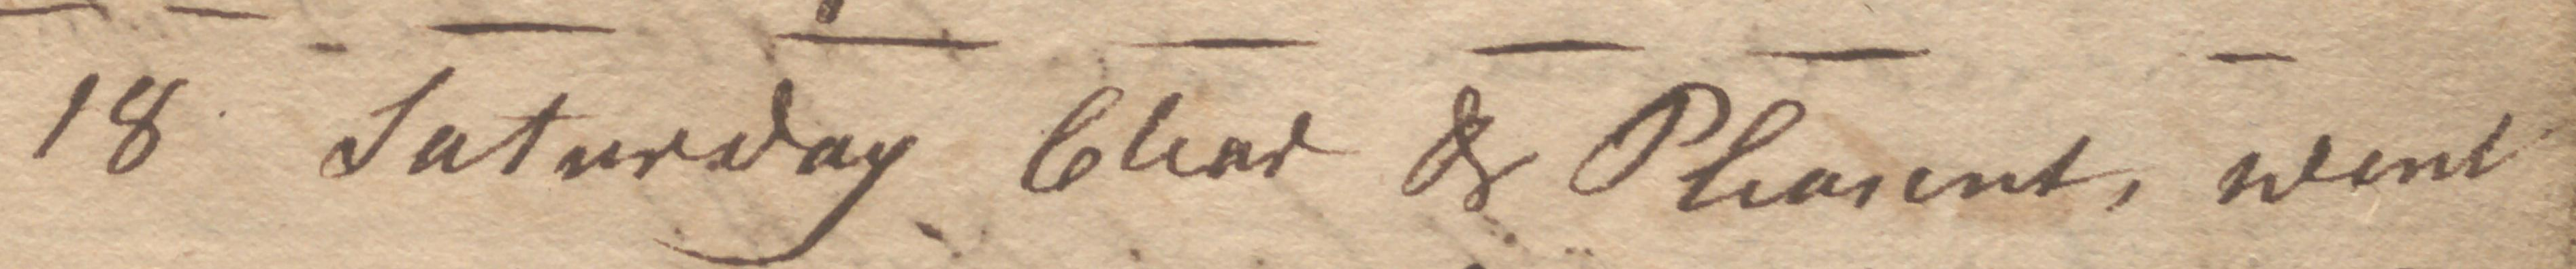18. Saturday Clear & Pleasent, went
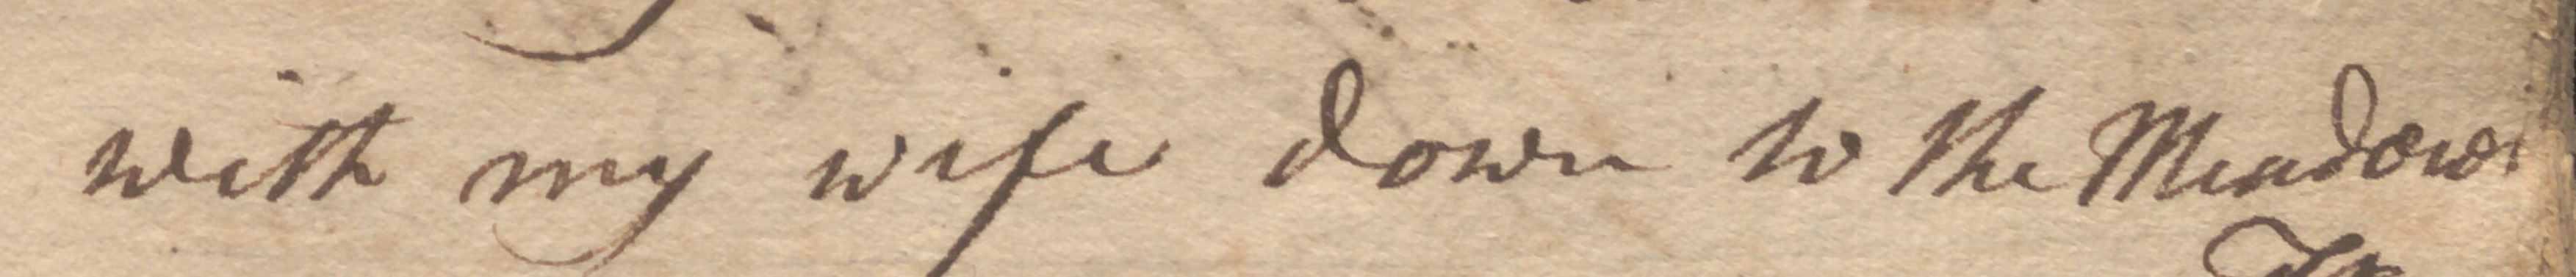with my wife down to the Meadows
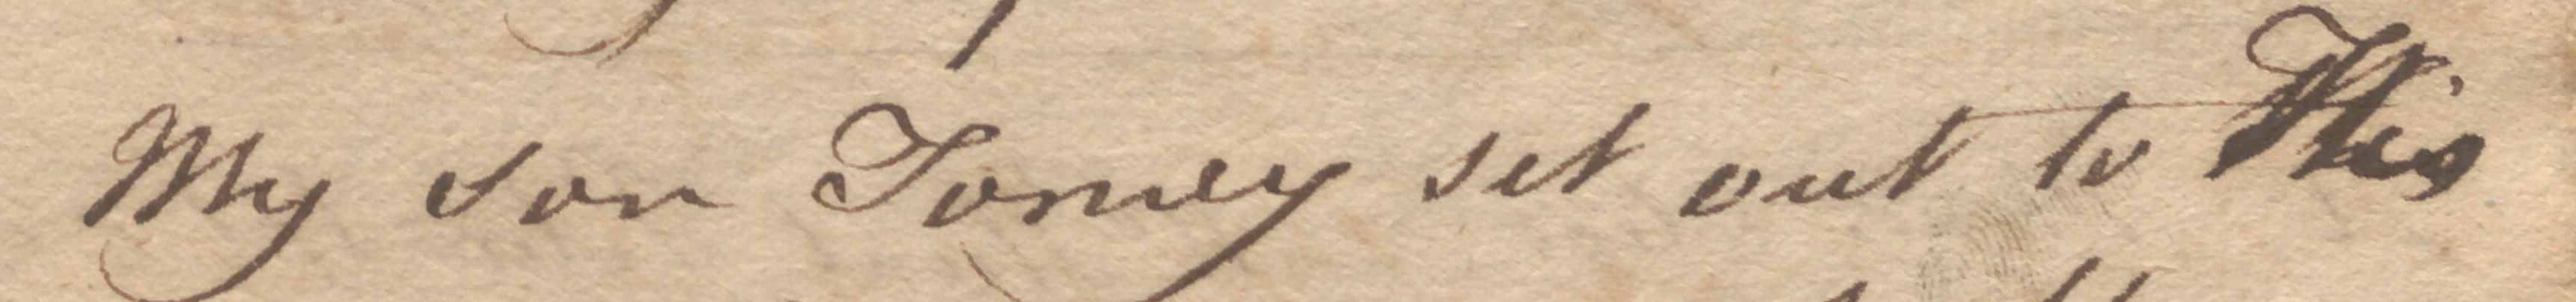My son Tomey set out to His
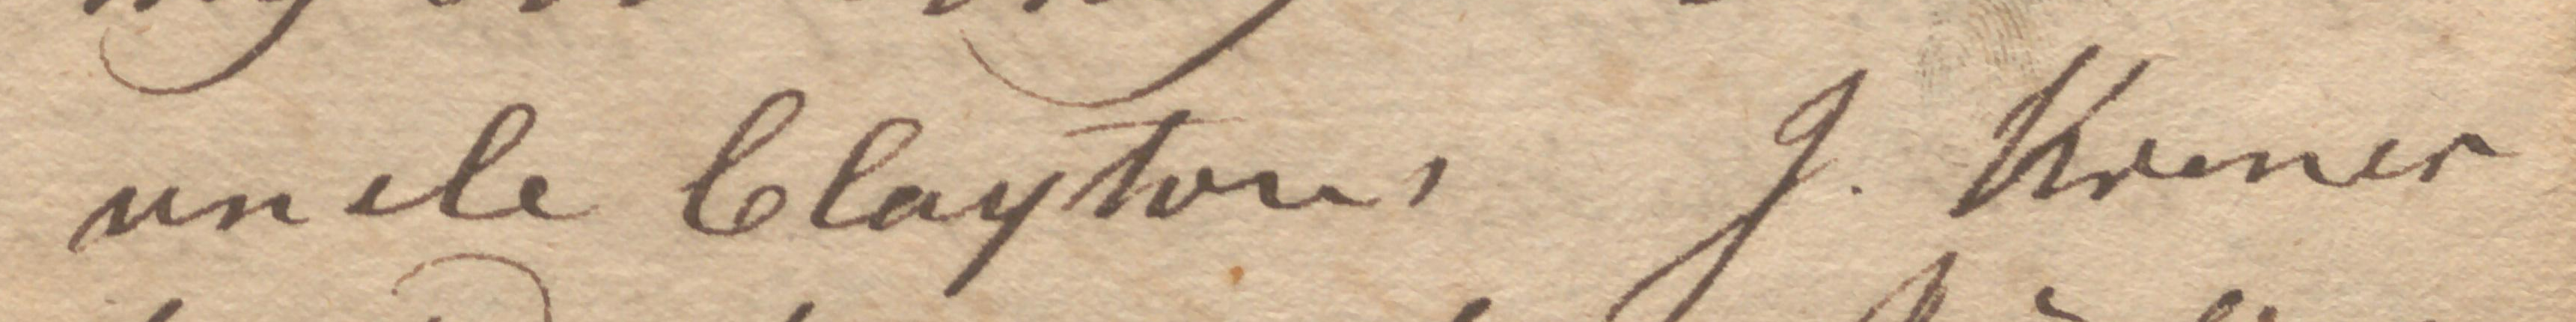uncle Claytons J. Krener
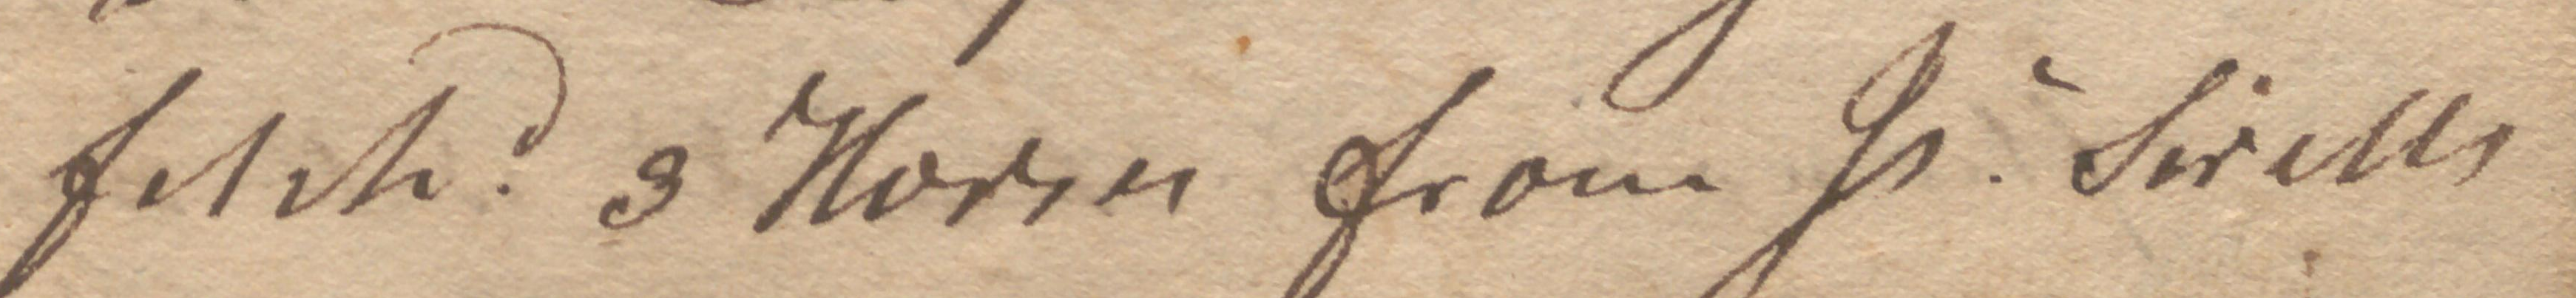fetch^d. 3 Horses from Is^l. Sirells
